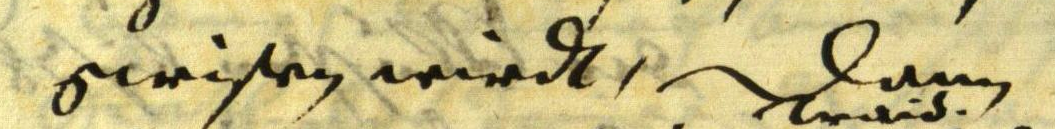gwisen wirdt, Dann
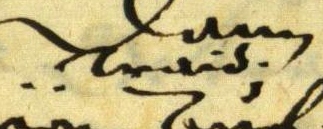:Traid:
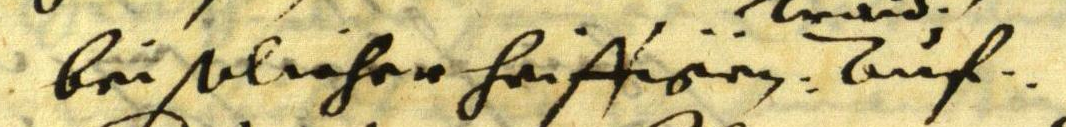bei solicher heiffigen : Aūf¬
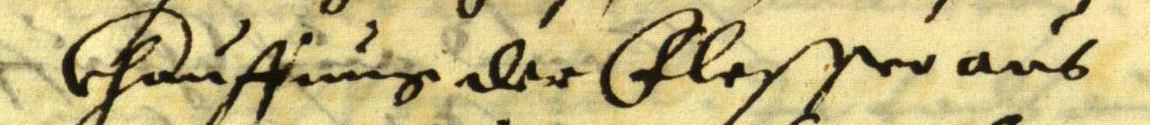khaūffūng der Flesser aūs
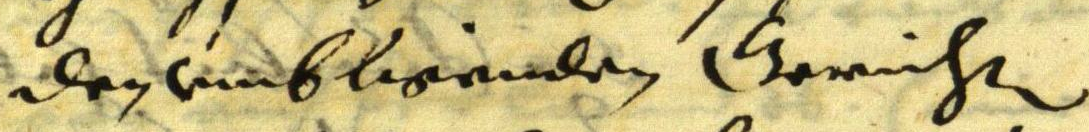den vmbligenden Gericht
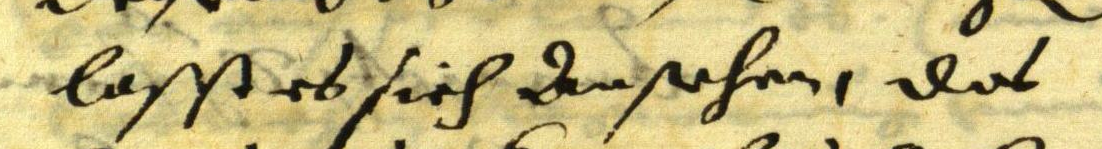lasst es sich Ansehen, das
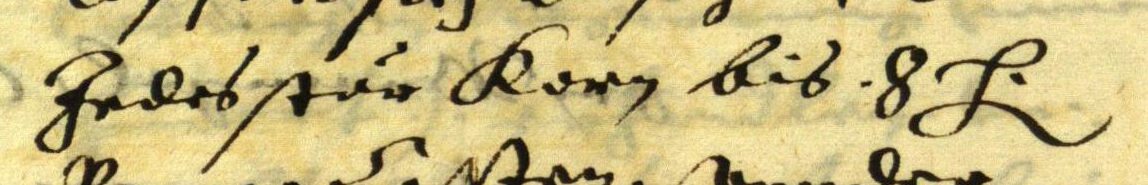Jedes stār Korn bis .8 L.
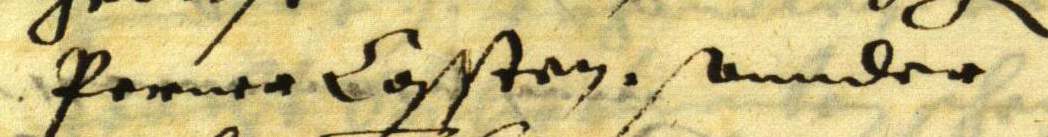Perner Cossten. sonnder
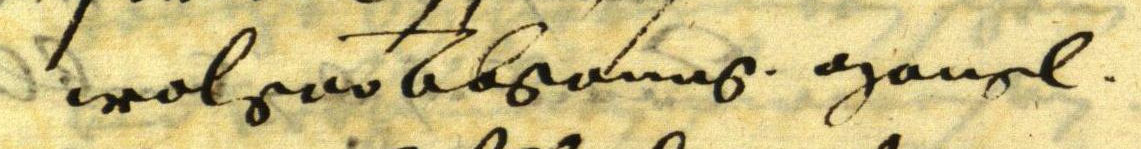wol gar Abganng. Mangl.
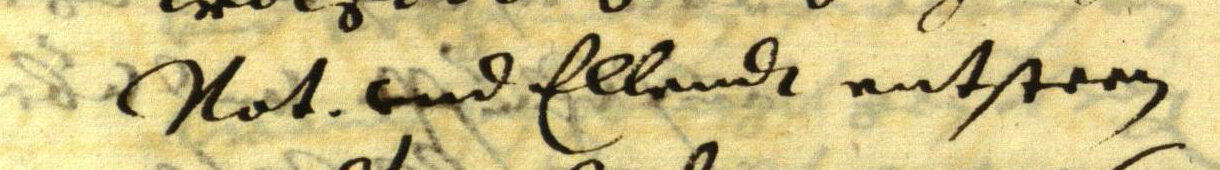Not. vnd Ellendt entsteen
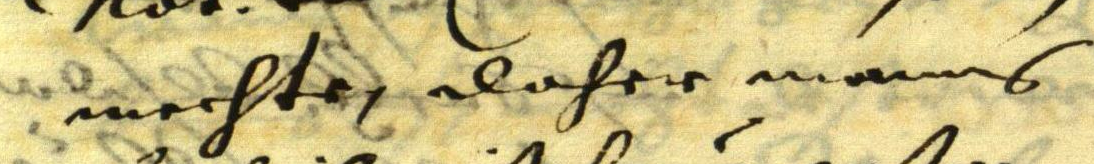mechten, daher manns
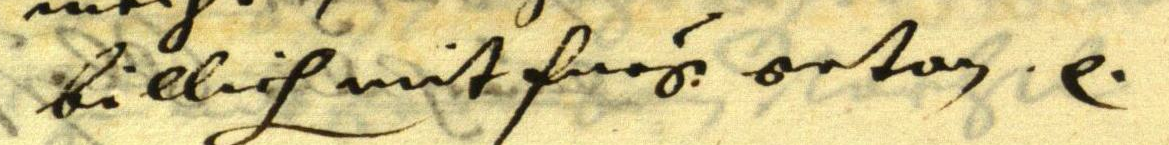billich mit fūeg getan. etc.
